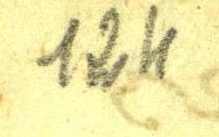124
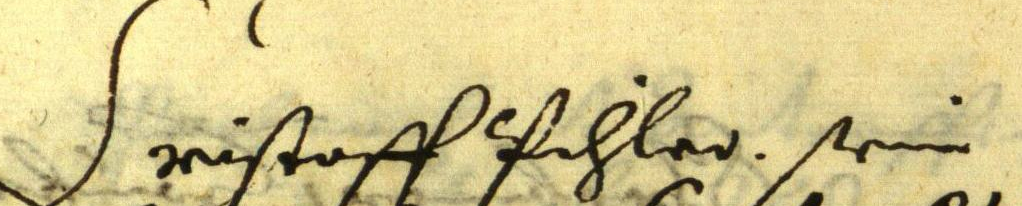Cristoff Pihler. sein
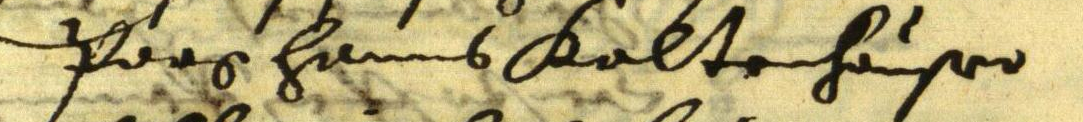Porg Hanns Kaltenhaūser
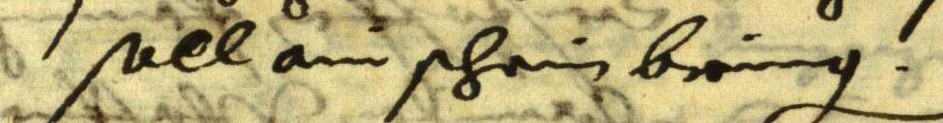soll ain schein bring.
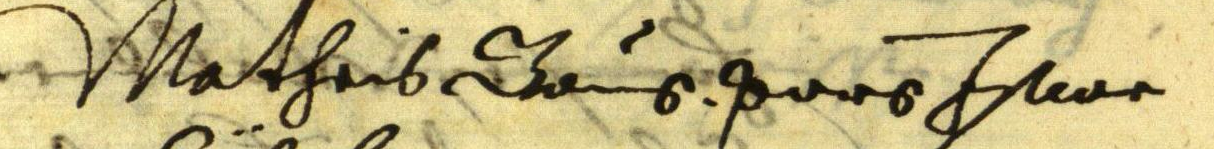Matheis Gaūg. Porg Iseac
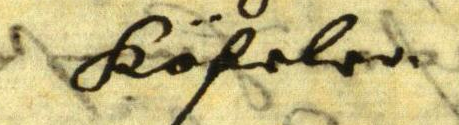Köfeler.
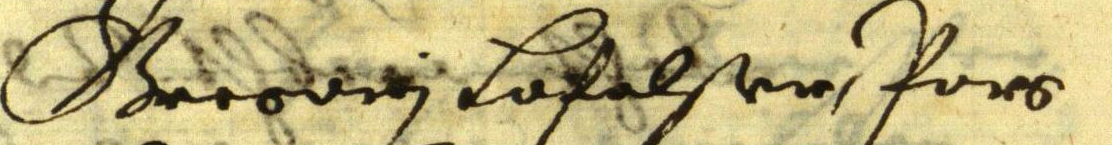Gregorj Lofalser, Porg
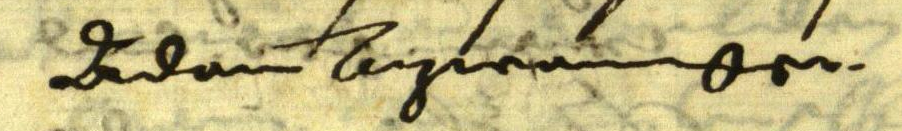Adam Azwannger.
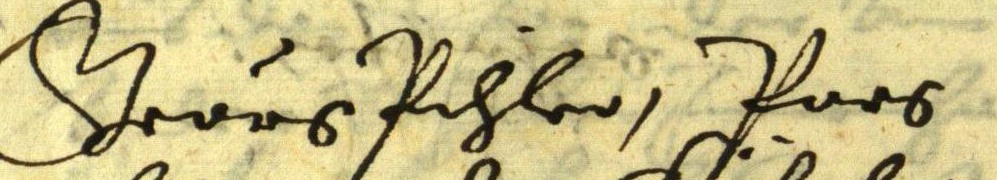Geōrg Pihler, Porg
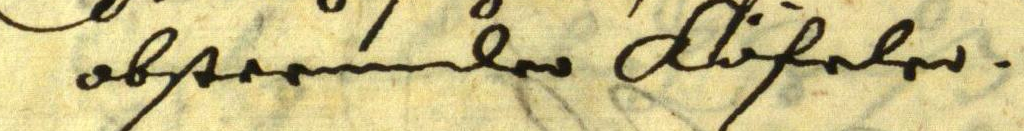obsteender Köfeler.
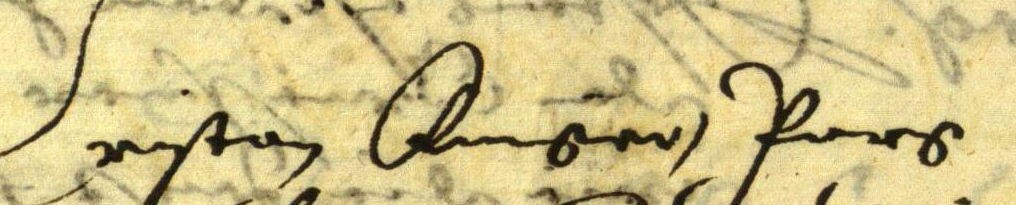Cristan Fūnger, Porg
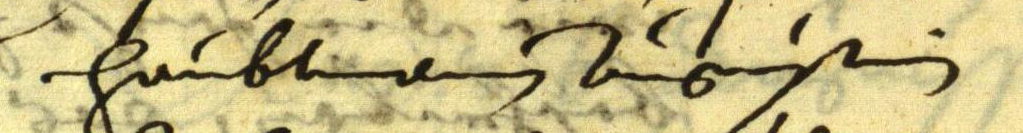Haūbtmann Aūgūstin
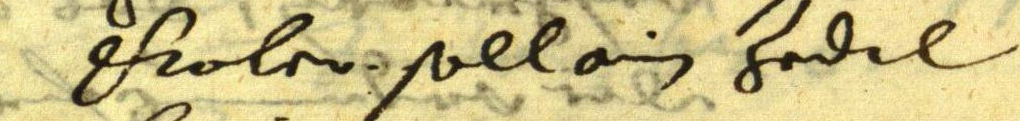Koler. soll ain Zedel
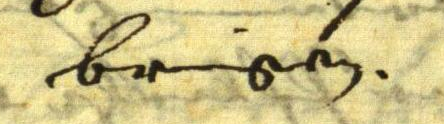bringen.
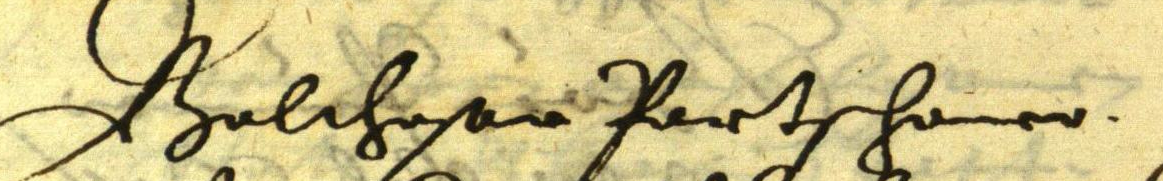Balthasar Partschoner.
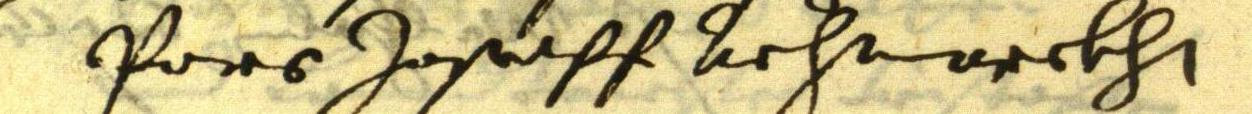Porg Joseff Achtmarckht
